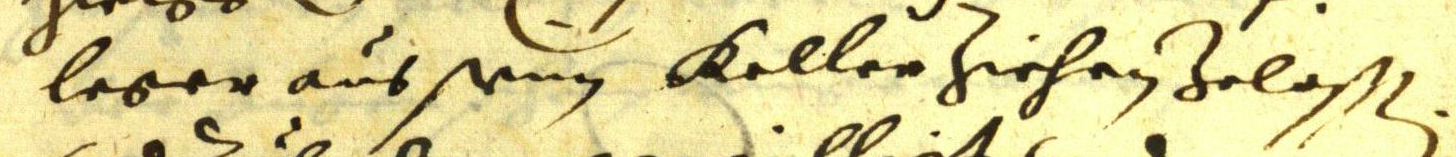leger aūs seim Keller Zichen Zelass.
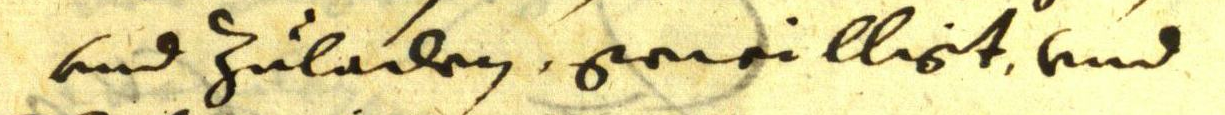vnd Zūladen. gewilligt. vnd
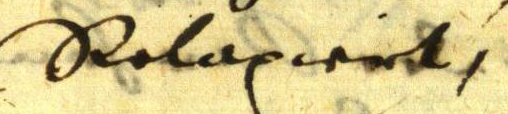Relaxiert,
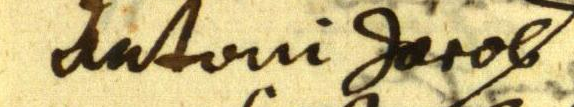Antoni Jacob
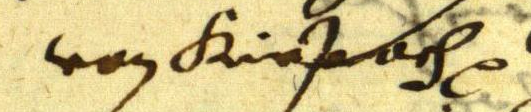von KiePach etc.
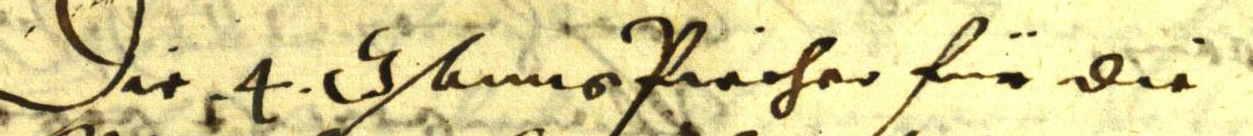Die .4. GsanngPpiecher für die
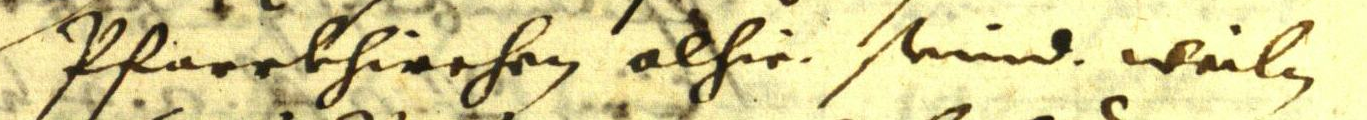Pfarrkhirchen alhie. seind. weiln
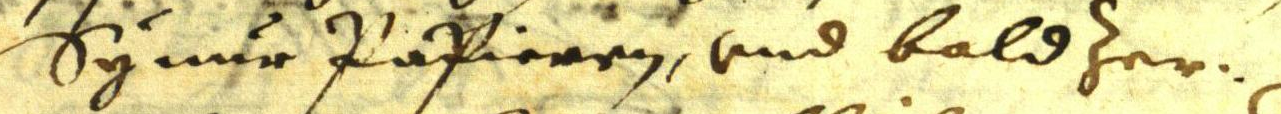Sȳ nūr PaPieren, vnd bald Zer¬
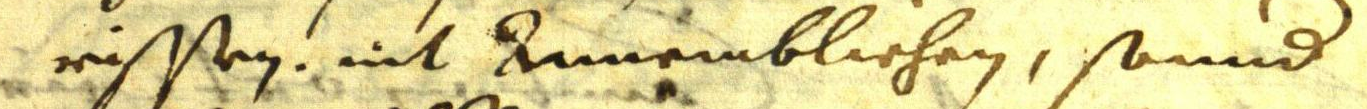rissen. nit Annemblichen, sonnd
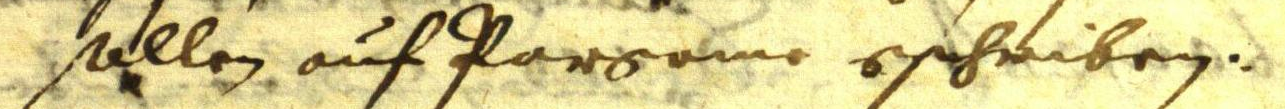sollen aūf Porgame gschriben¬
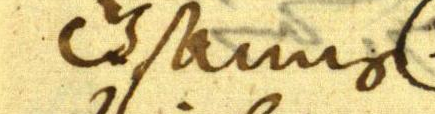Gsanng¬
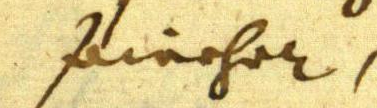piecher,
